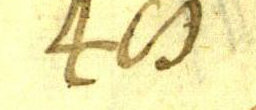48
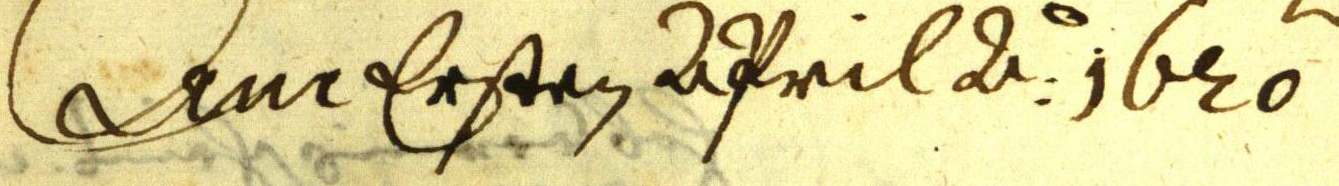Am Ersten APril Ao: 1620 t
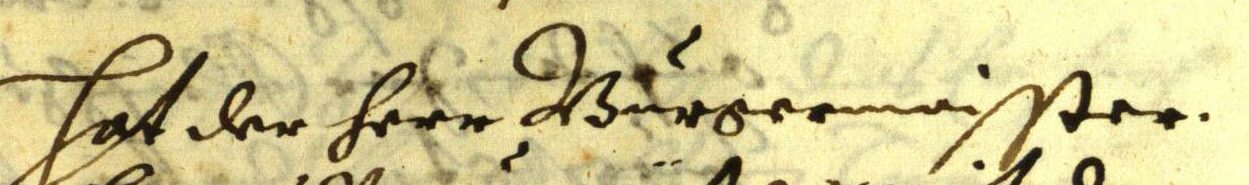hat der herr Būrgermaisster.
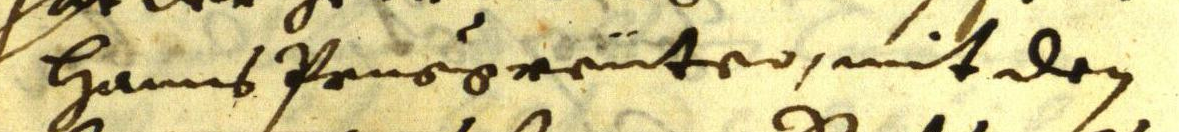Hanns Prūggreüter, mit den
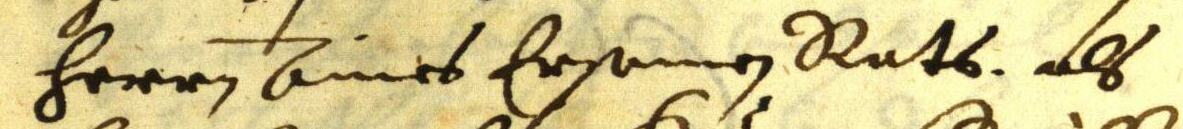herrn Aines Ersamen Rats. als
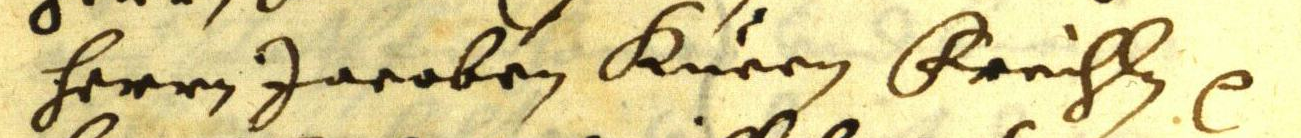herrn Jacoben Kūeen Freihn etc
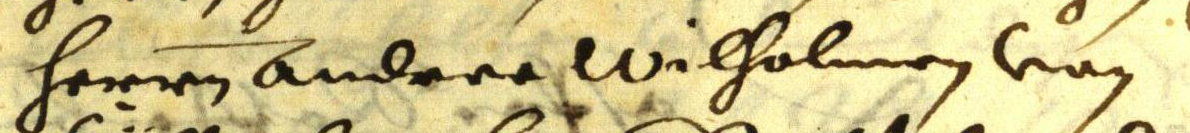herrn Andree Wilhalmen von
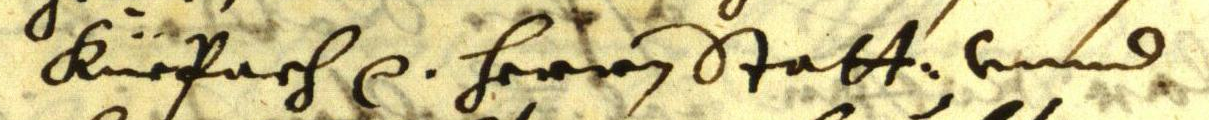KüePach etc. herrn Statt: vnd
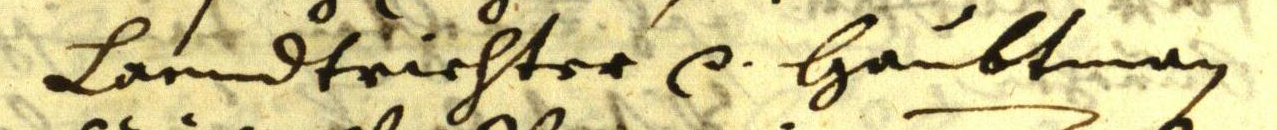Lanndtrichter etc. Haūbtman
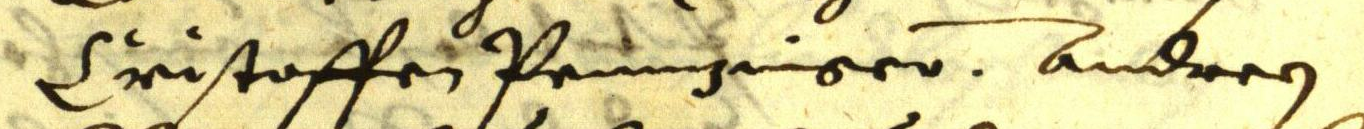Cristoffen Pennzinger. Andren
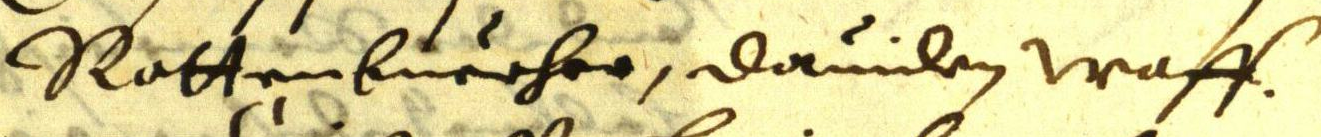Rottenbūecher, Daūiden Waff¬
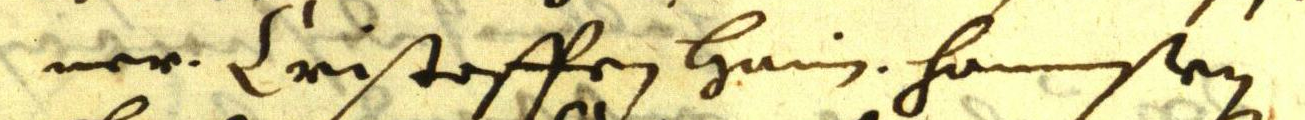ner. Cristoffen Haim. hannsen
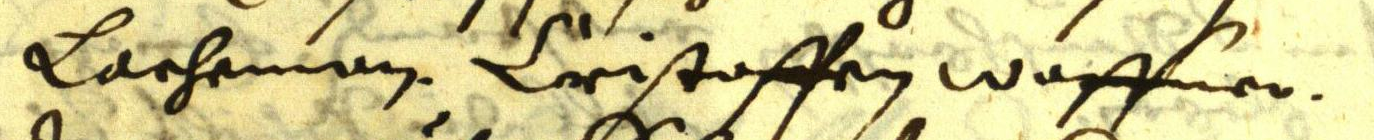Locheman. Cristoffen Waffner.
